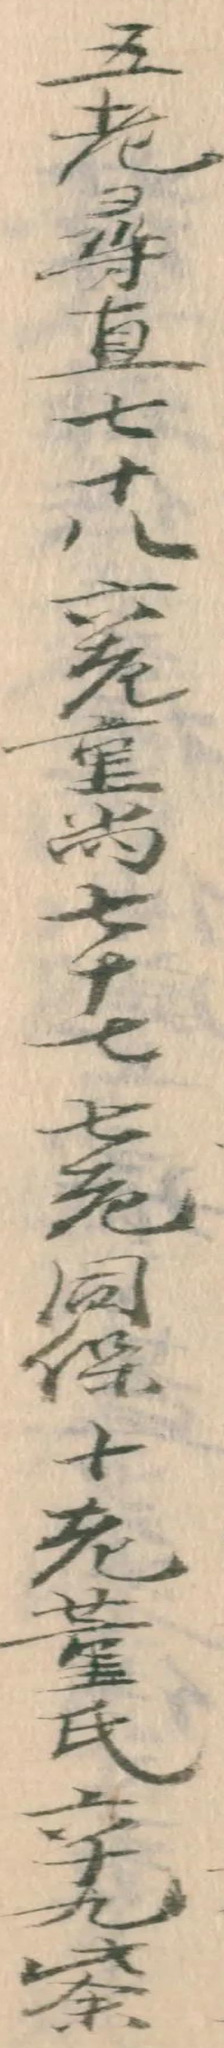五老尋直七十八六老重尚七十七七老同保十老董氏六十九此余
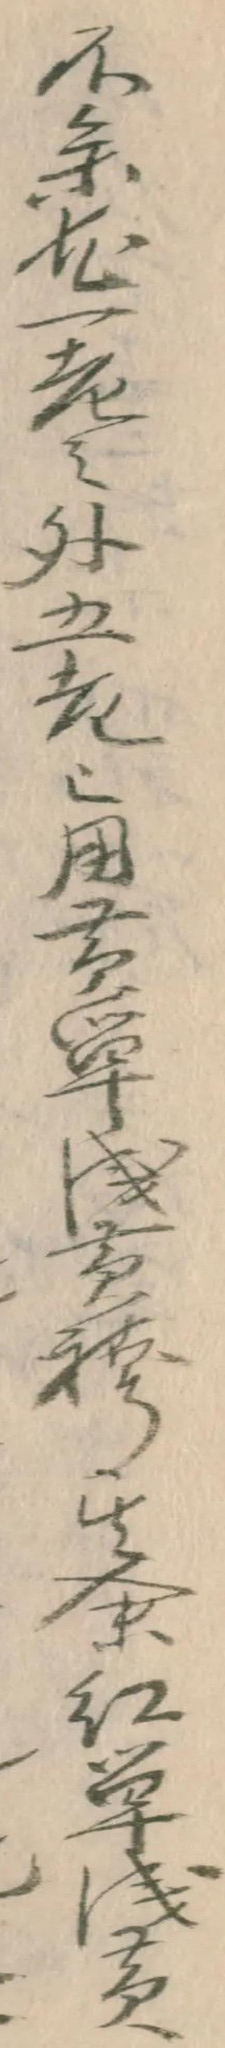不参尤一老之外五老之用黄単浅黄袴其余紅単浅黄
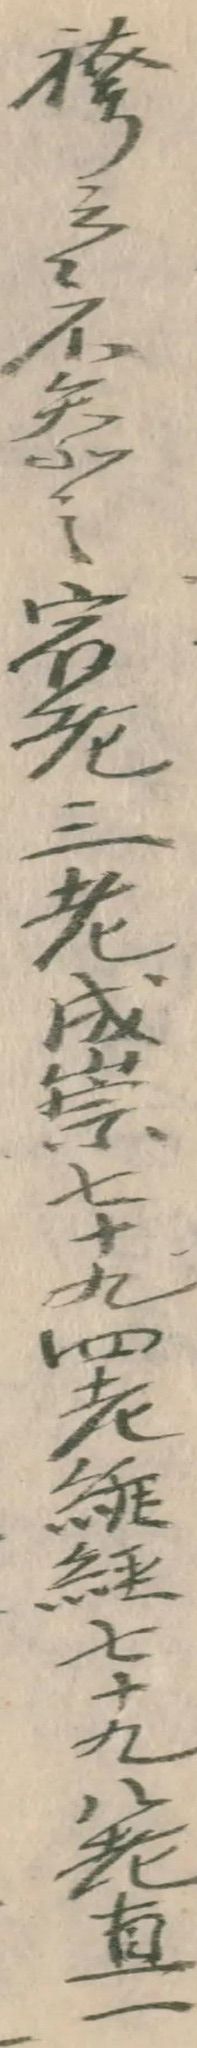袴云々不参之宿老三老成崇七十九四老維経七十九八老直一
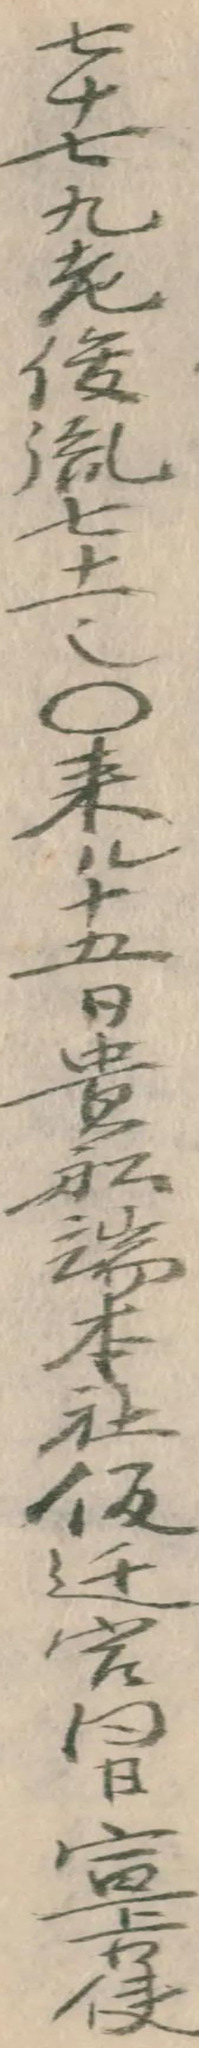七十七九老後胤七十一也〇来ル十五日貴舩端本社仮遷宮同日宣旨使
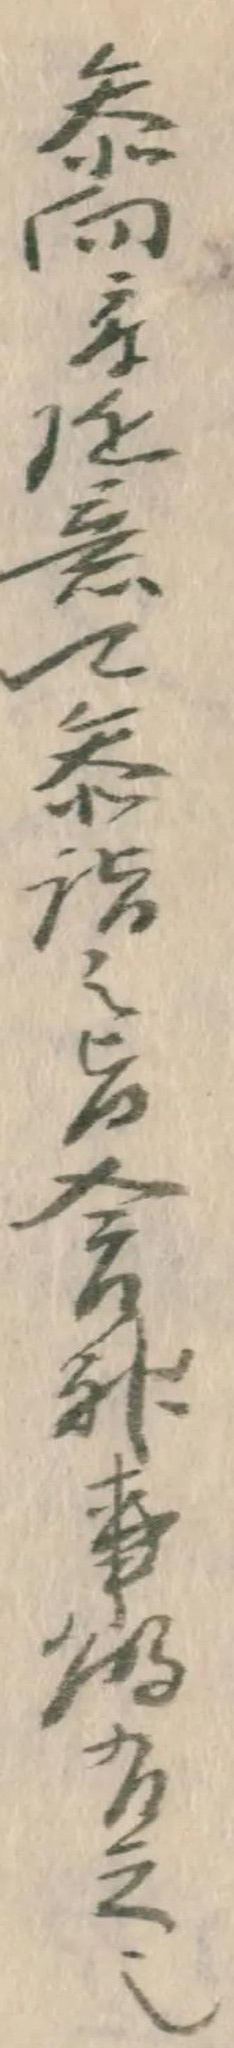参向ニ付随意可参詣之旨入差神事觸有之也
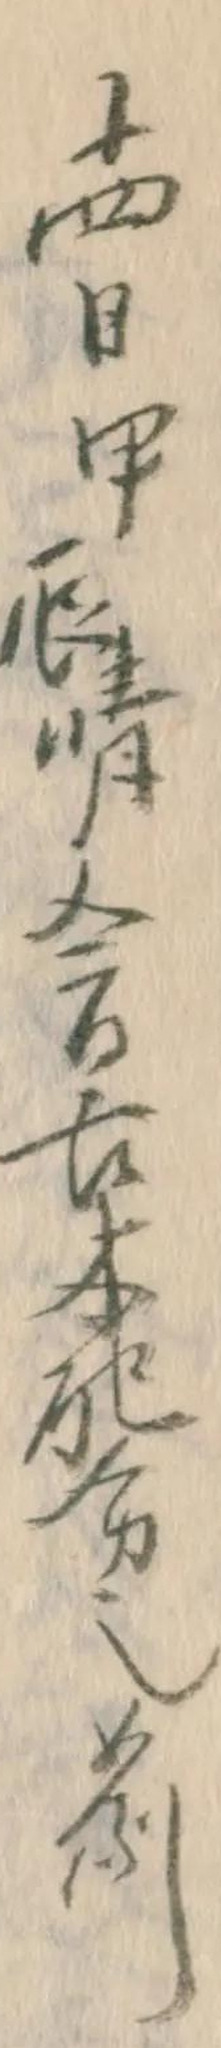十四日甲戌晴文盲古木配分也如例
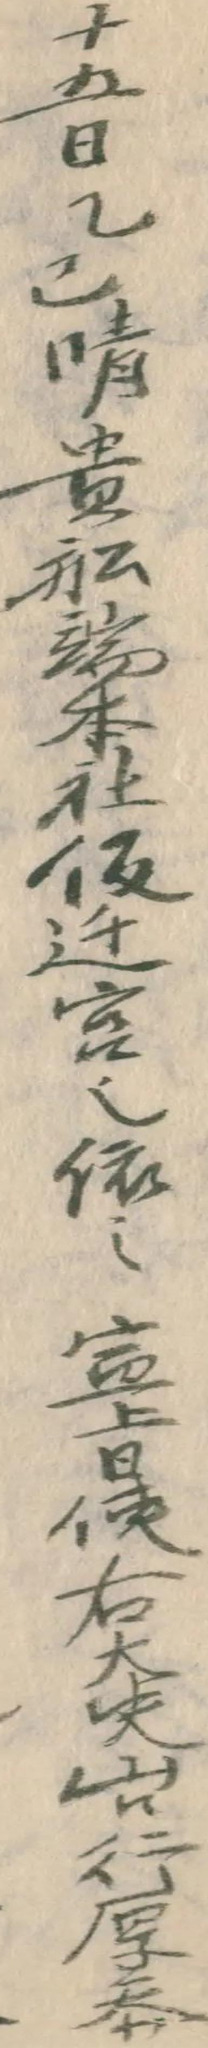十五日乙巳晴貴舩端本社仮遷宮也依之宣旨使右大史山口行厚参
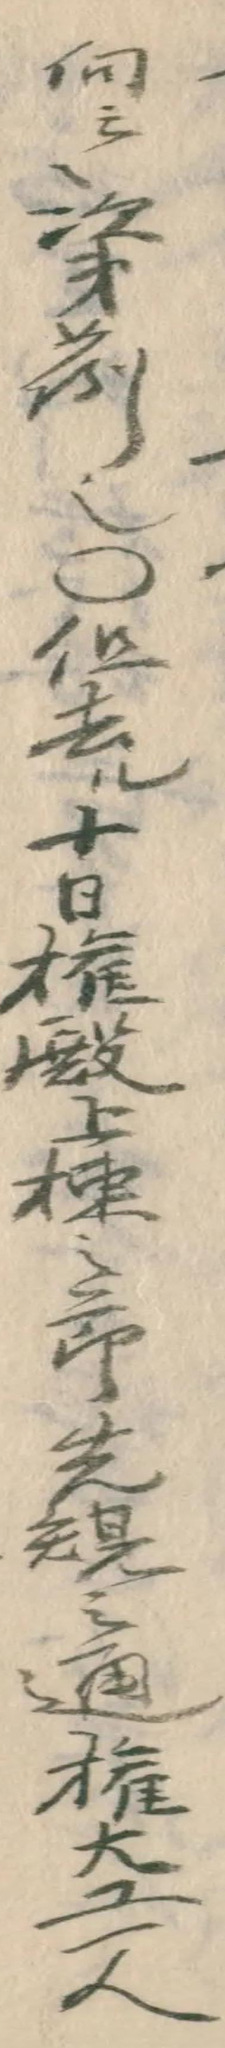向云々次第如例也○但去ル十日権殿上棟之節先規之通権大工一人
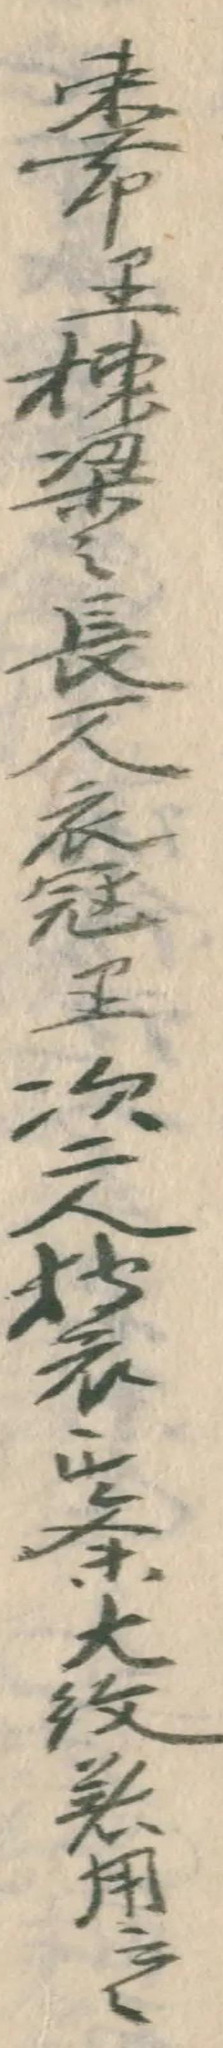束帯黒棟梁之長一人衣冠黒次二人狩衣正条大紋着用云々
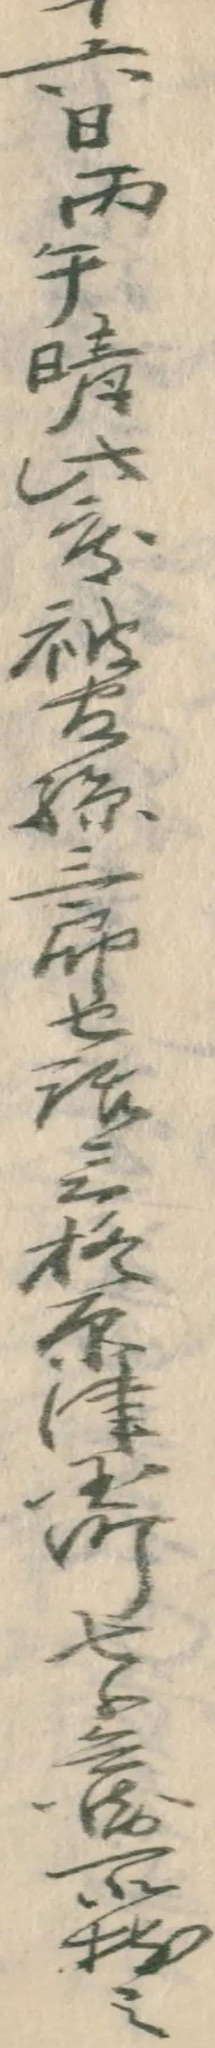十六日丙午晴此度被官孫三郎世話ニ而柊原津国町七郎兵衛所持之
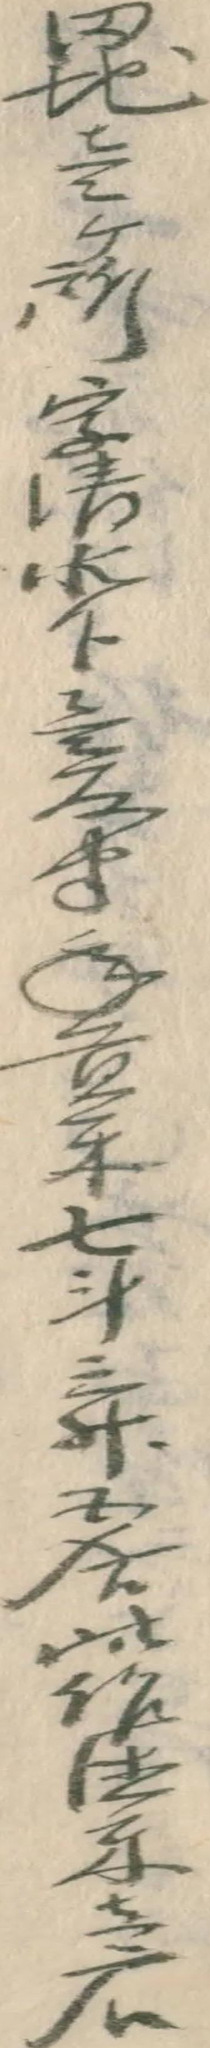田地壱ヶ所字清水下壱反半年貢米七斗三升五合此作徳米壱石
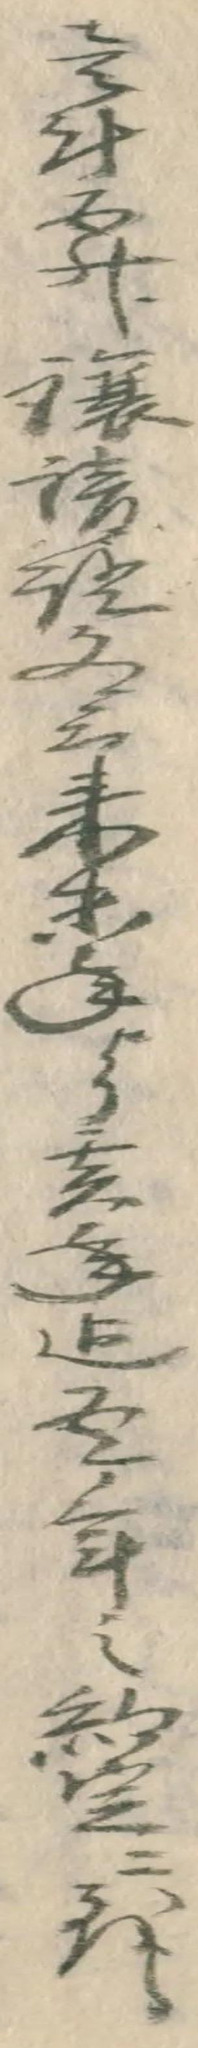壱斗五升譲請証文ニ而来未年より亥年迄五ヶ年之約定ニ致引
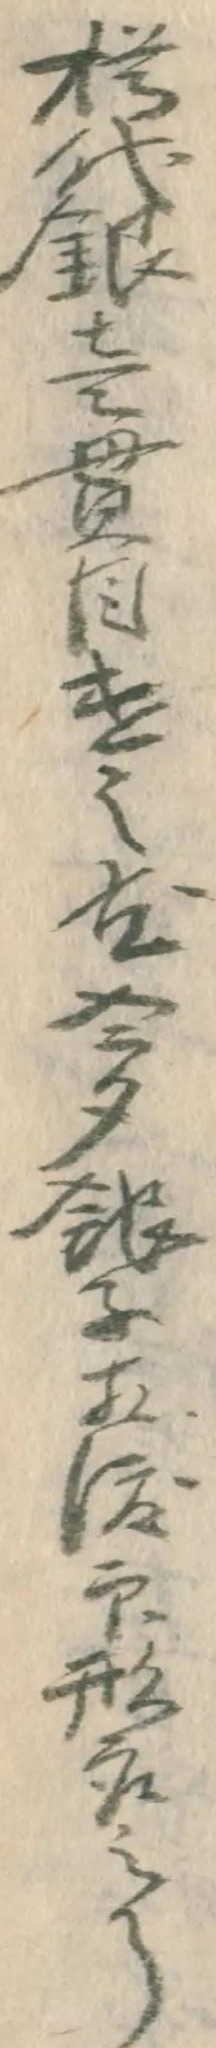樽代銀壱貫目遣之尤今夕銀子相渡印形取之了

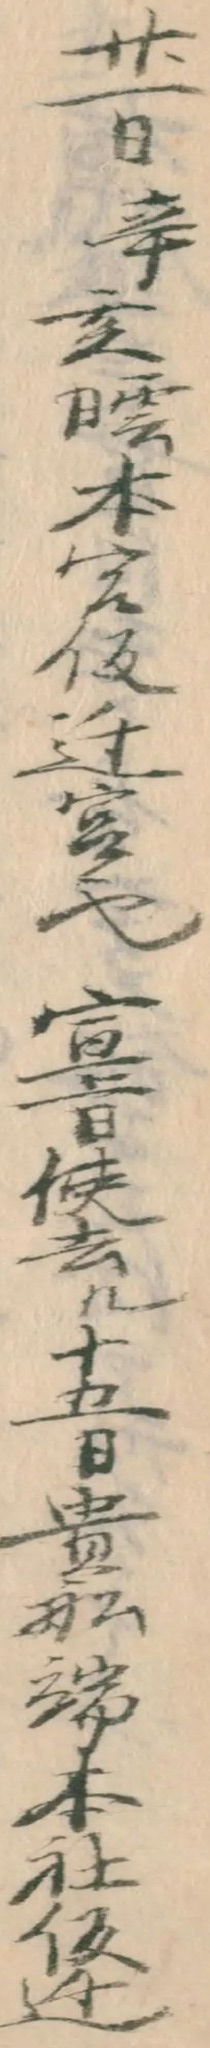廿一日辛亥曇本宮仮遷宮也宣旨使去ル十五日貴舩端本社仮遷
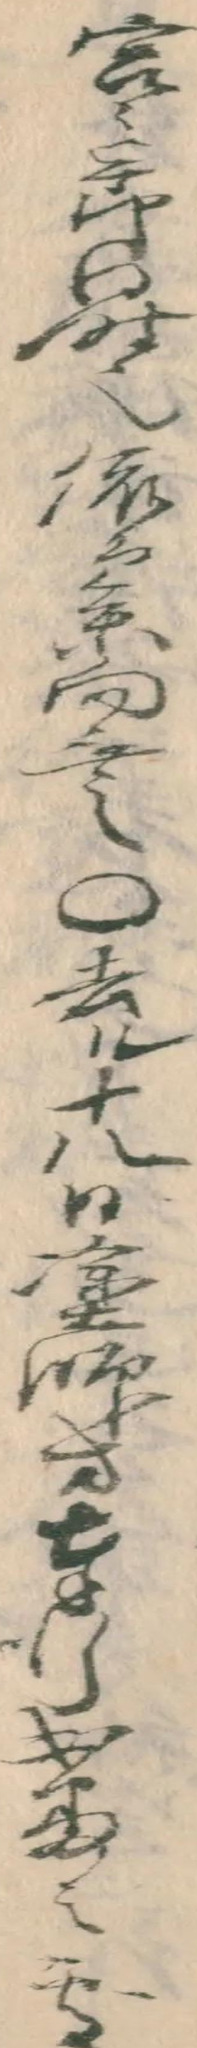宮之節同時也依而参向無之○去ル十八日塗師方奉行出番之處
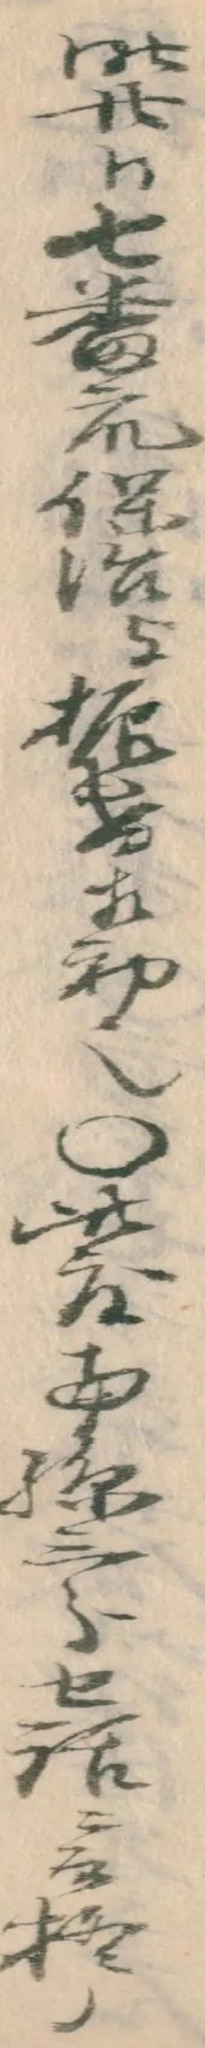昨廿日七番衆保治と振替相勤也○此度南孫三郎世話ニ而柊ノ
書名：賀茂社記録. 第66冊
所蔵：国立国会図書館 National Diet Library, JAPAN
